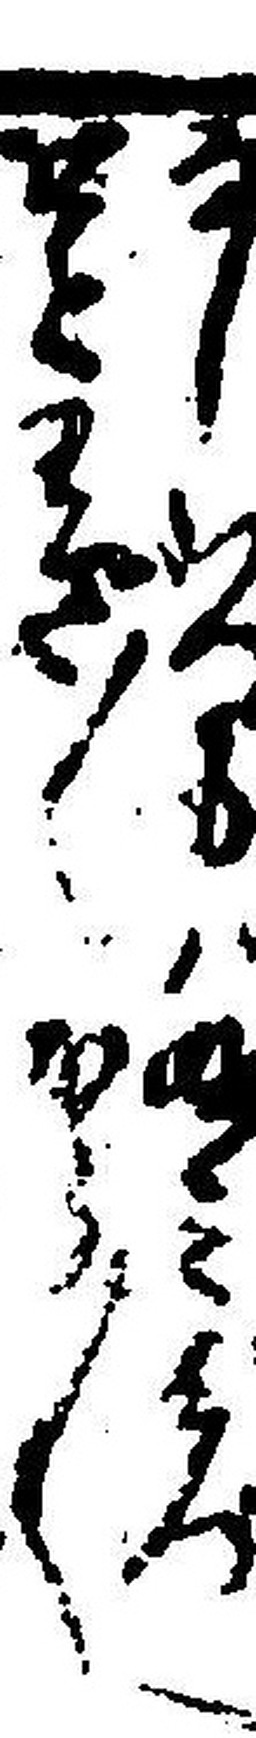せとわざ〳〵ほう〳〵
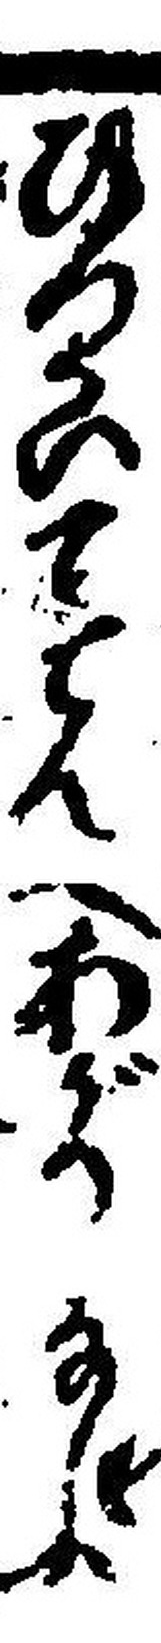ひつかいててんへあがり給ふ
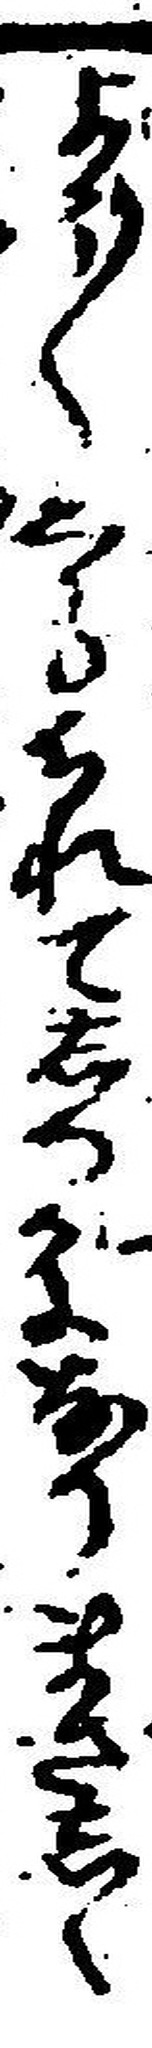よう〳〵くもはれてしつかになりまさしく
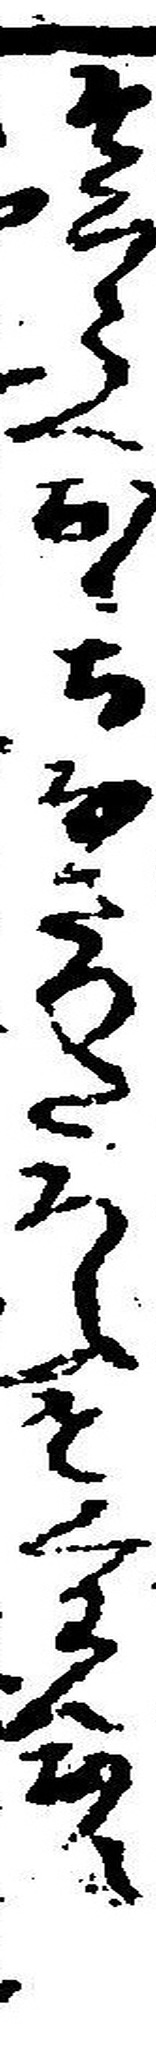そこらへおちなさつたろふとくわんおん
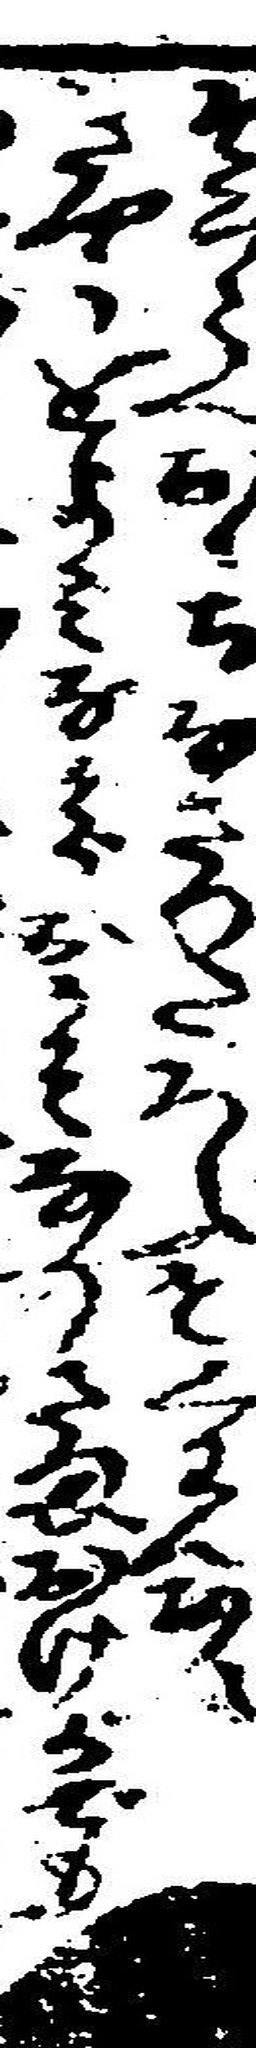きやうをよみなからおかみなりさまおけがでも
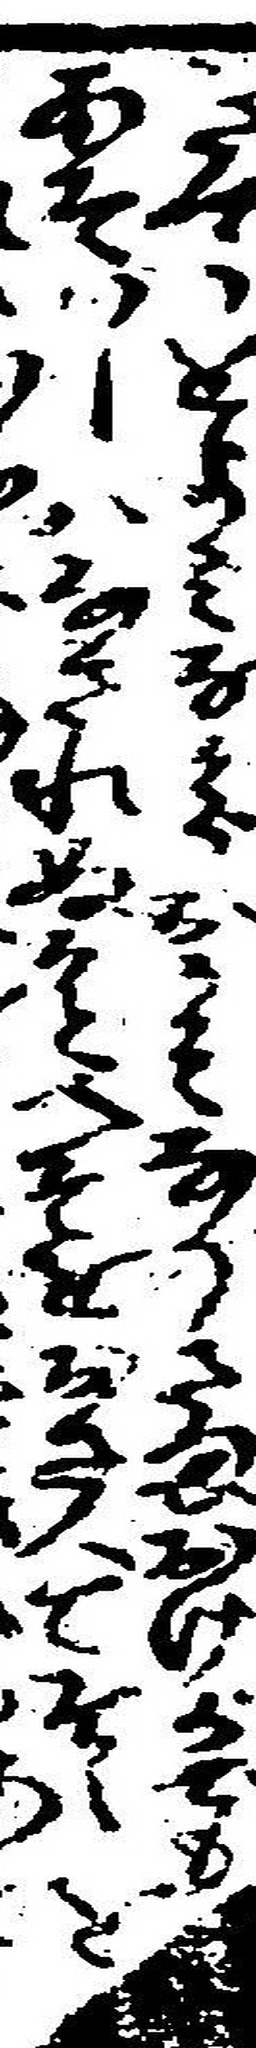あそはしはなされぬかとへそをおさへてそらを
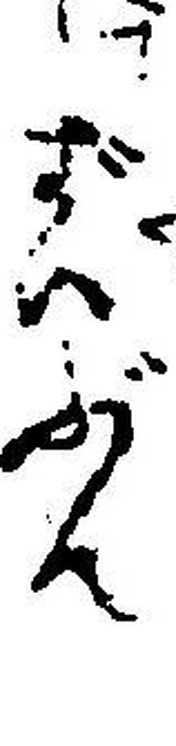ずいぶん
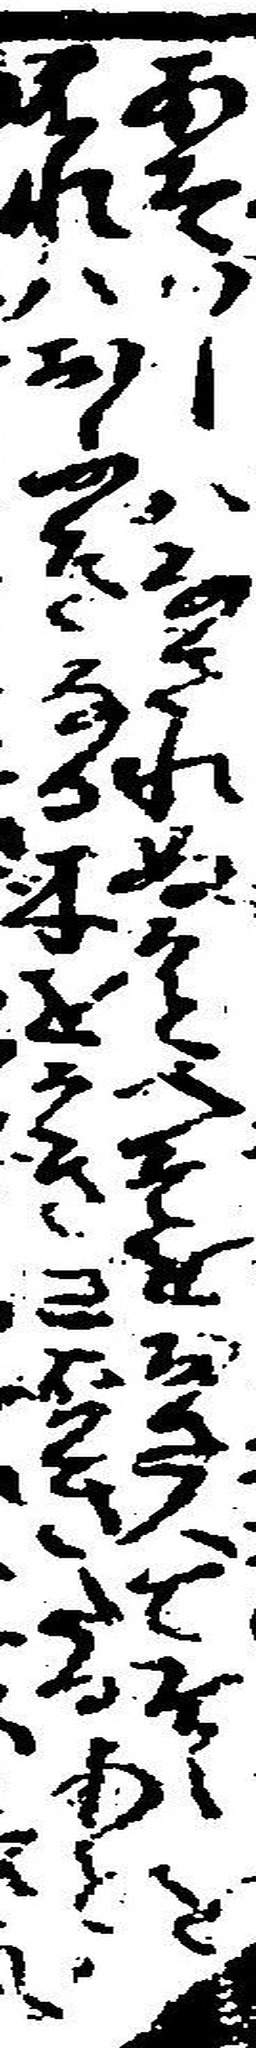見れはおふきなる木をかきさばきたるあと
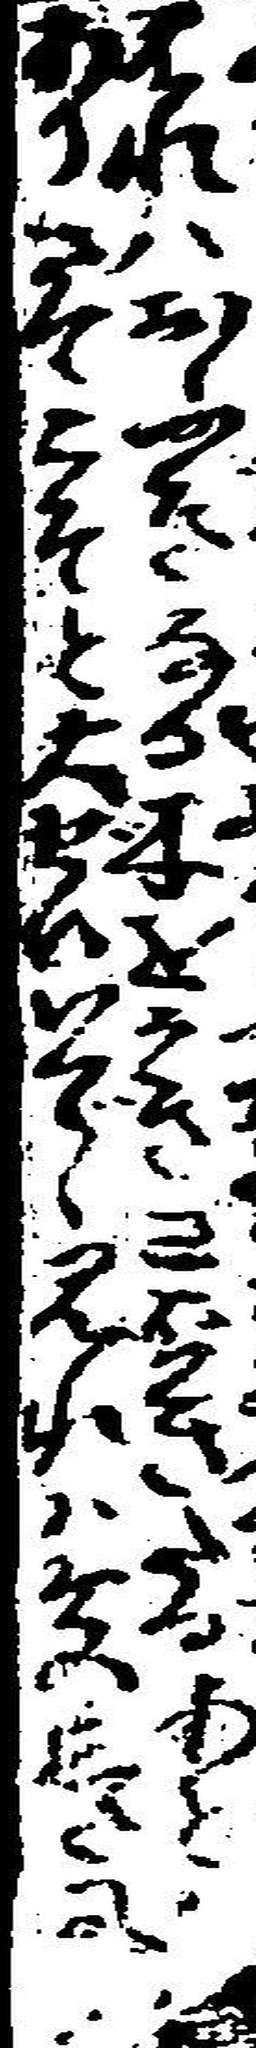ありさてこそと大ぜいいでゝ見れはそのしたに
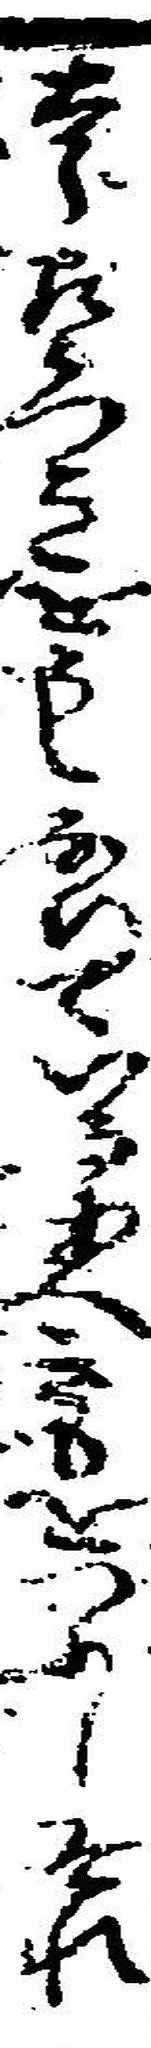太郎左衛門きをうしないているゆへきもをつふしそれ
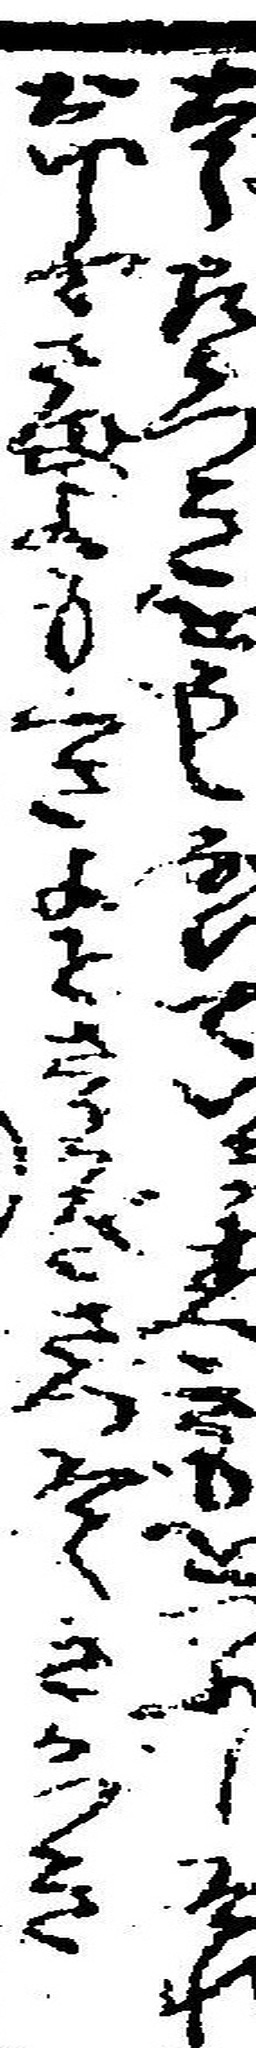おいしやさまよもくさよとさわぎさつそくきかつき
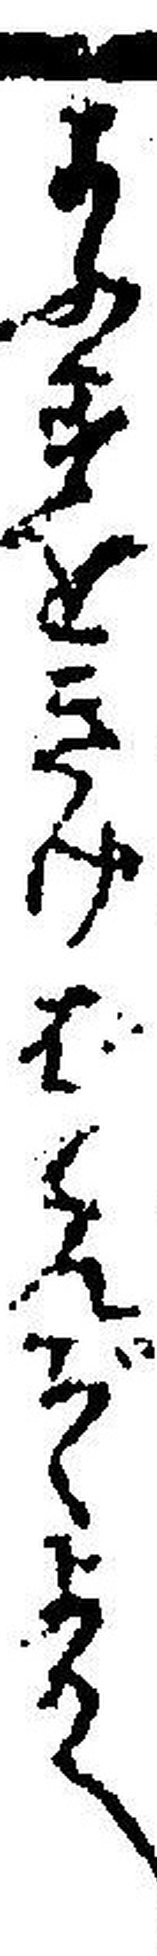よふすをきけばてんぢくより
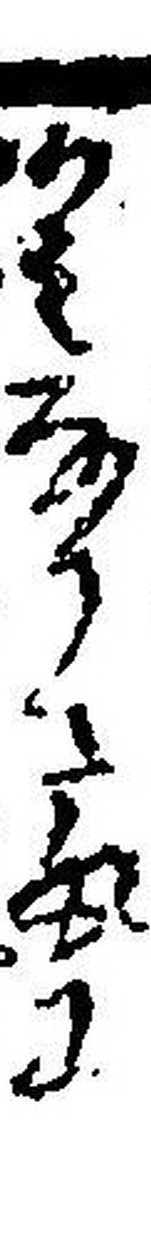かみなりさまに
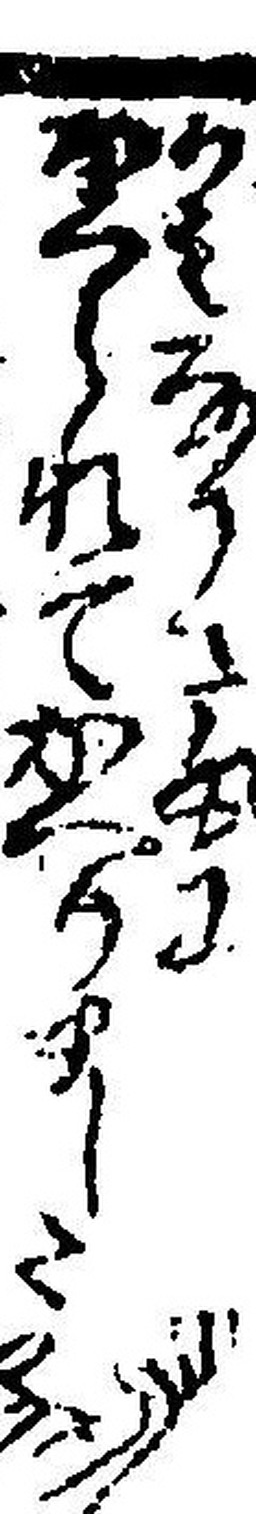おくられてかへりました
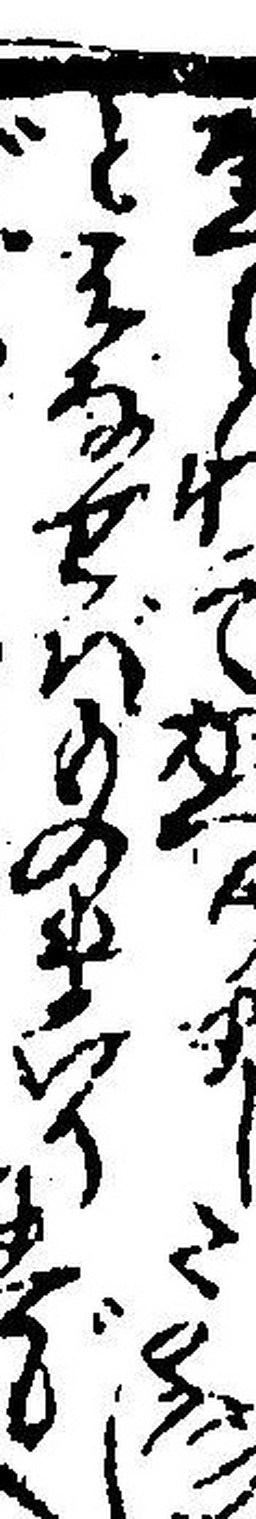とはなせばものまいりにでも
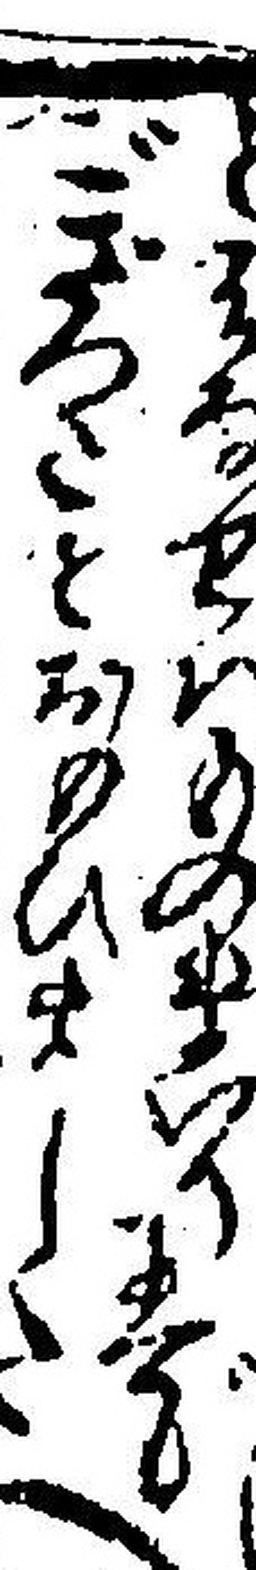ござつたとおもひました
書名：牡丹餅棚有 / 市場通笑作
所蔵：東京大学総合図書館 General Library in the University of Tokyo, JAPAN
